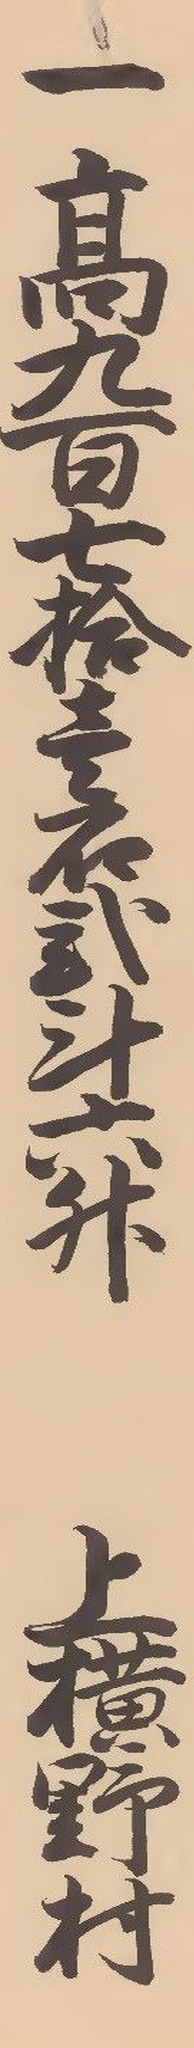一高九百七拾壱石弐斗六升上横野村
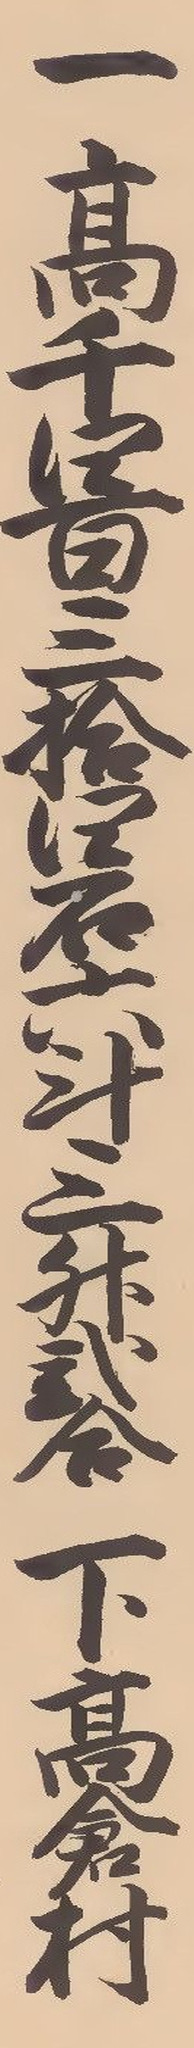一高千四百三拾四石六斗三升弐合下高倉村
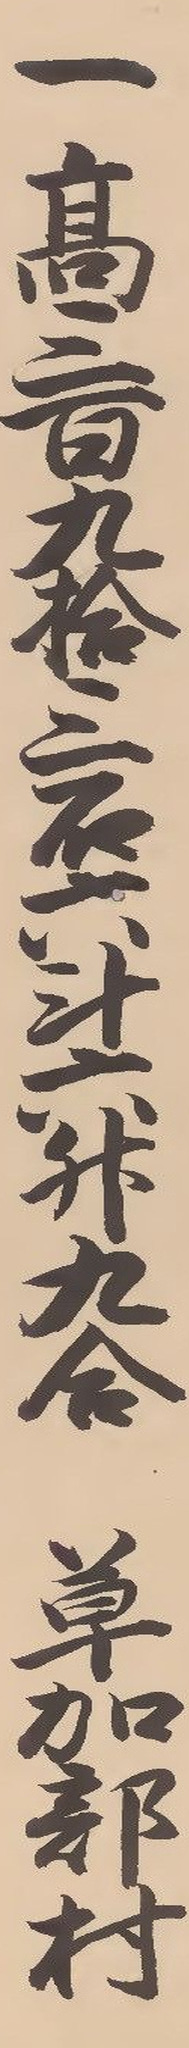一高三百九拾三石六斗六升九合草加部村
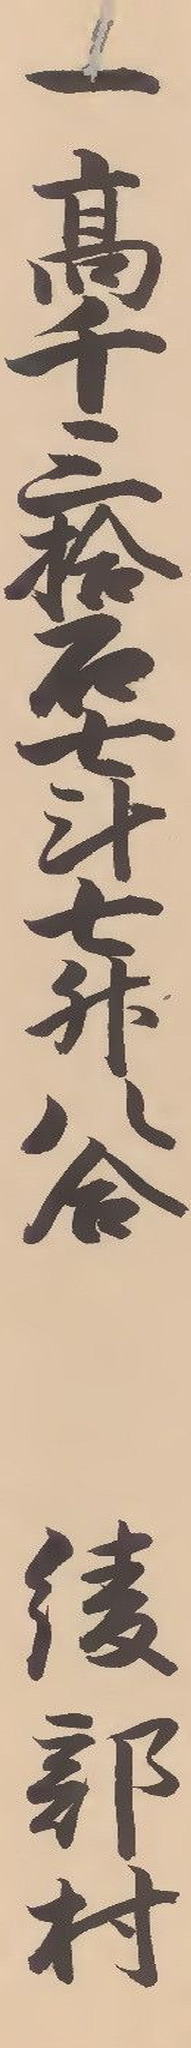一高千三拾石七斗七升八合綾部村
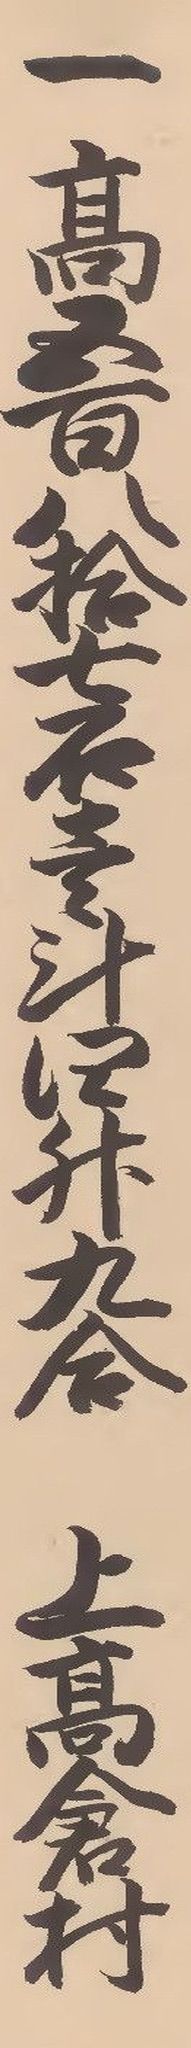一高五百八拾七石壱斗四升九合上高倉村
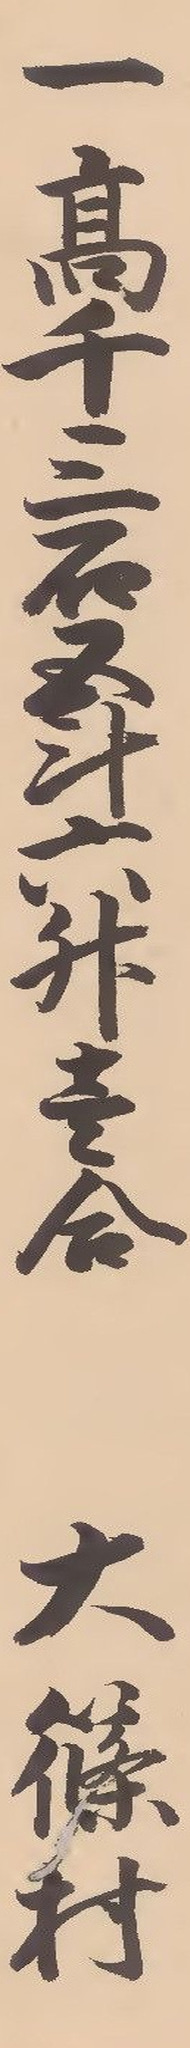一高千三石五斗六升壱合大篠村

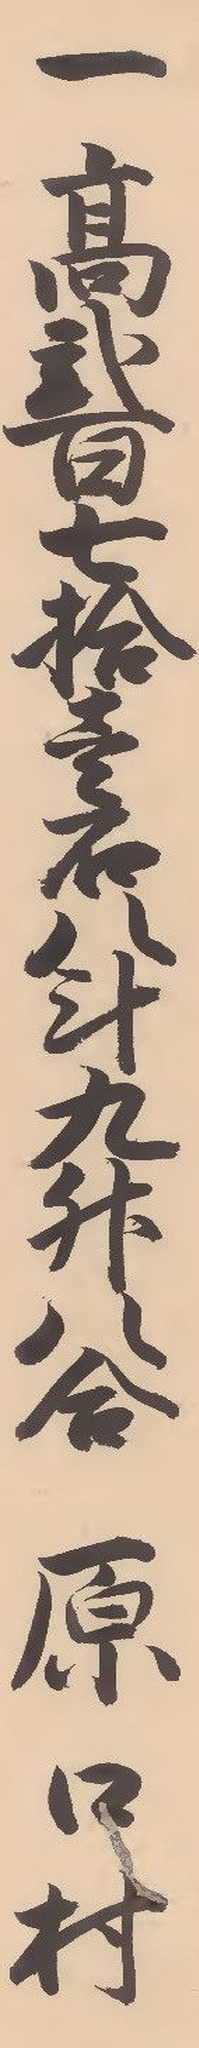一高弐百七拾壱石八斗九升八合原口村
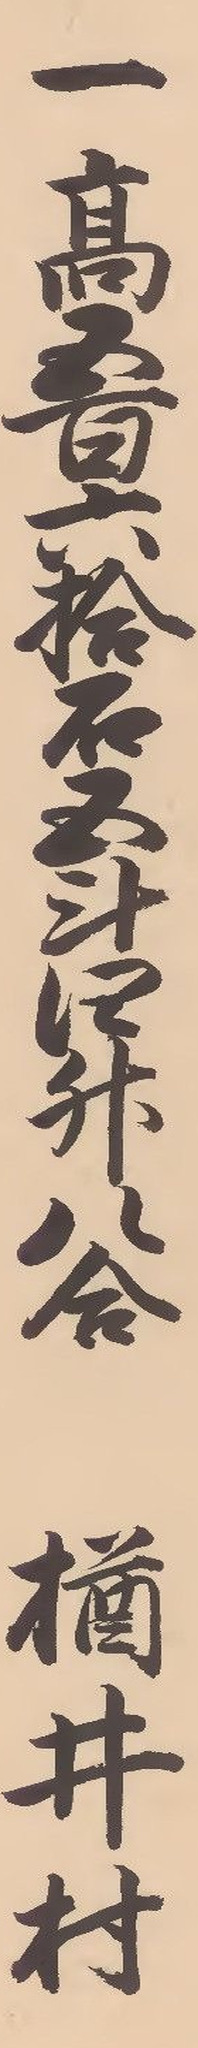一五百六拾石五斗四升八合楢井村
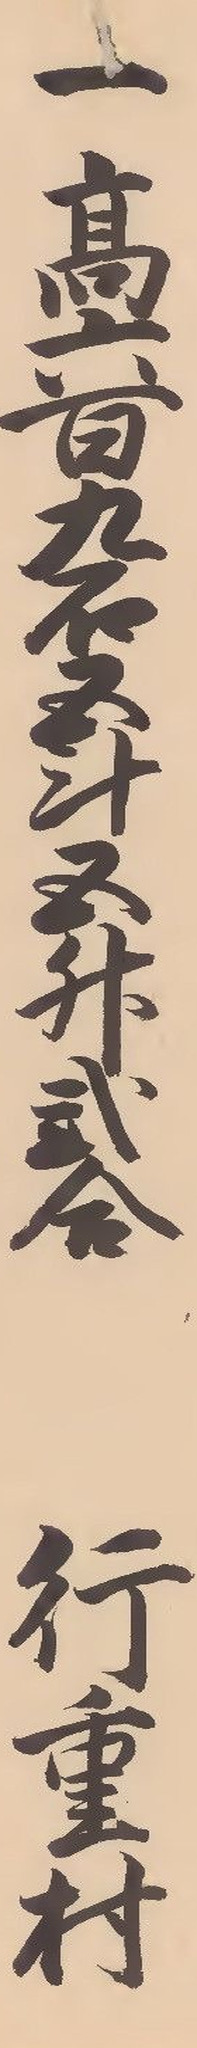一高六百九石五斗五升弐合行重村
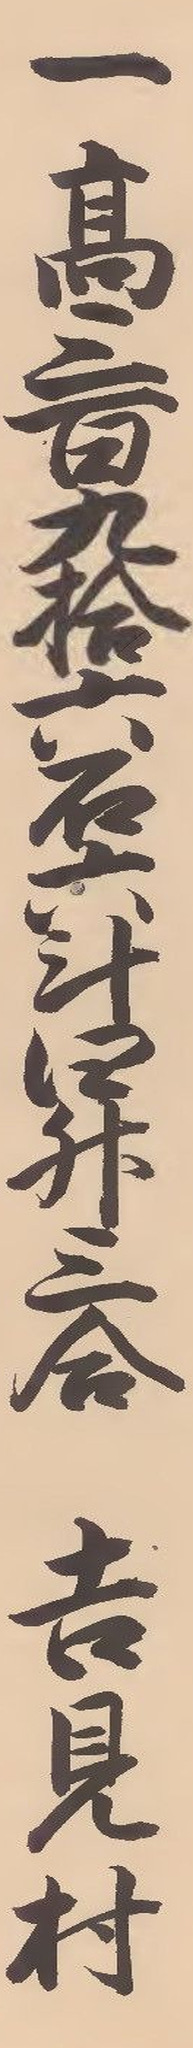一高三百九拾六石六斗四升三合吉見村
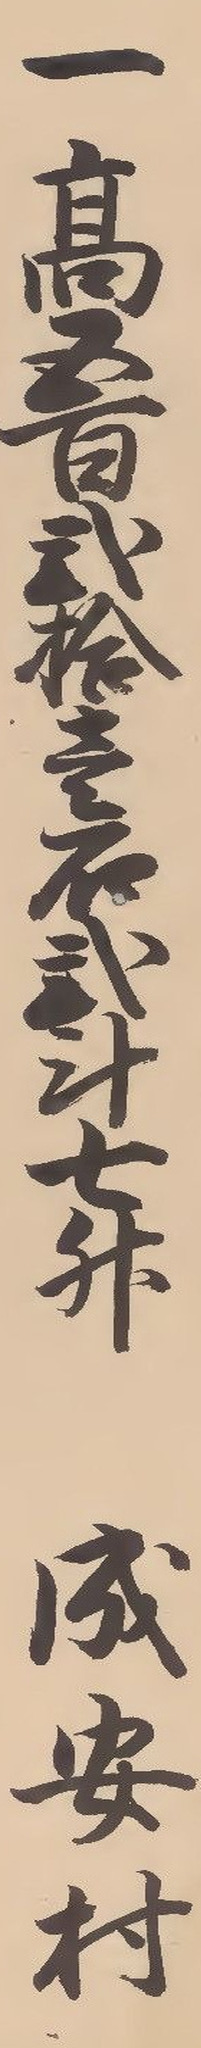一高五百弐拾壱石弐斗七升成安村
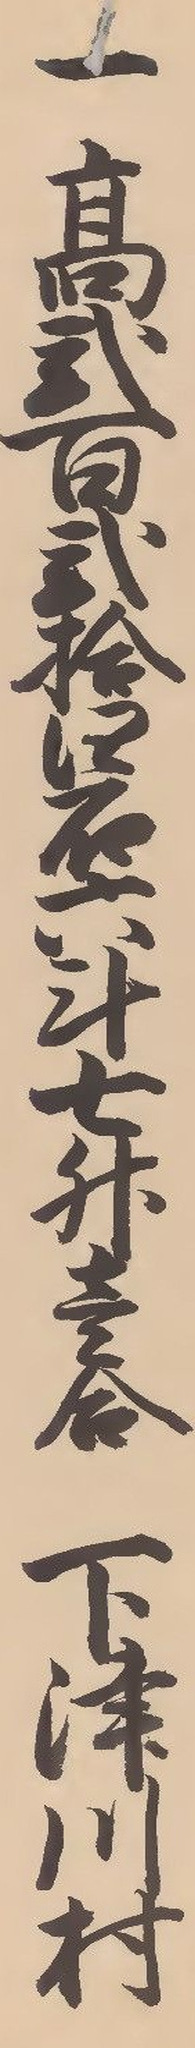一高弐百弐拾四石六斗七升壱合下津川村
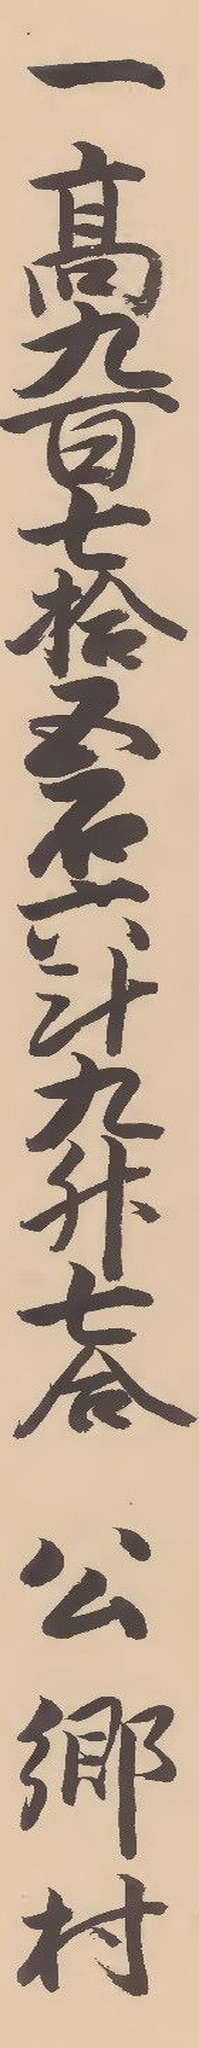一高九百七拾五石六斗九升七合公郷村
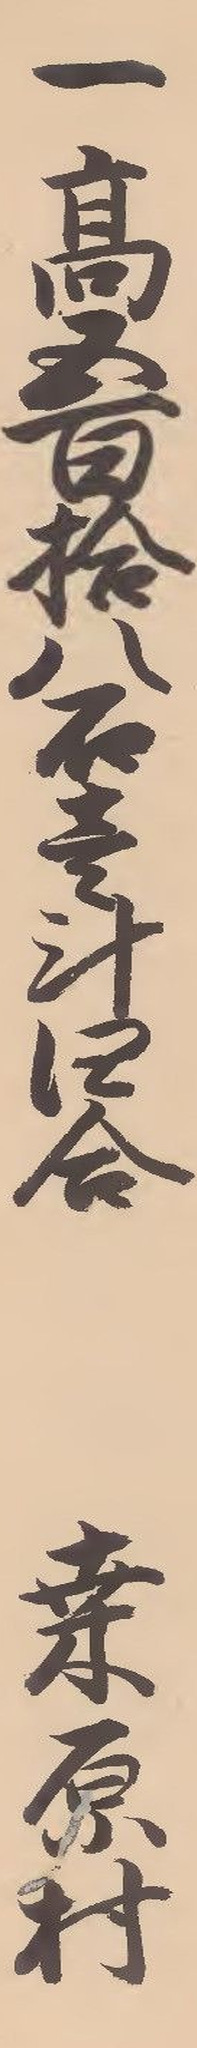一高五百拾八石壱斗四合桑原村

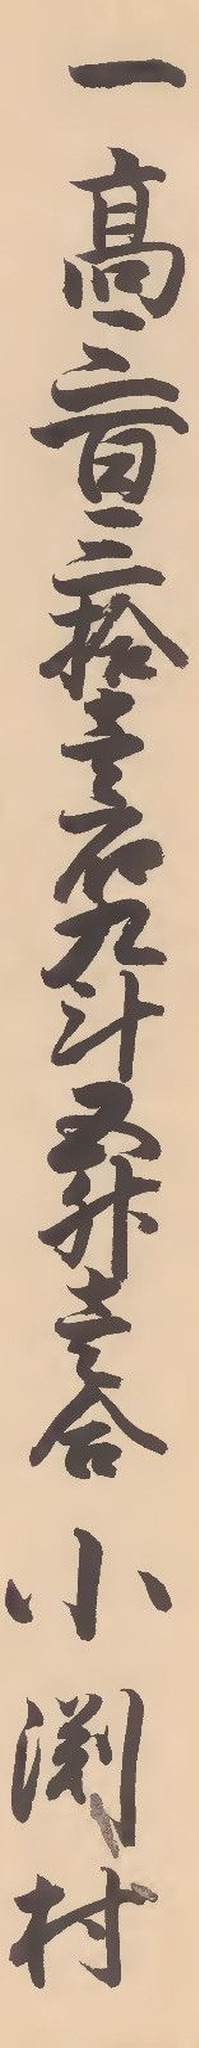一高三百三拾壱石九斗五升壱合小淵村
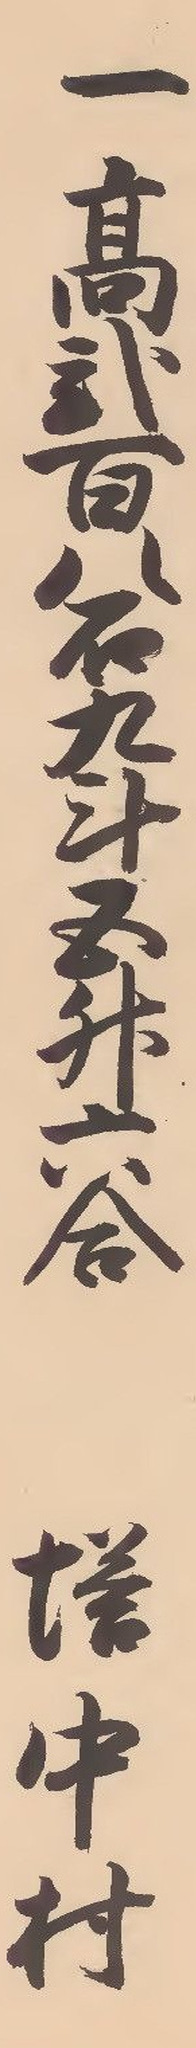一高弐百八石九斗五升六合塔中村
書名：美作国郷帳
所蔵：国立公文書館 National Archives of Japan
